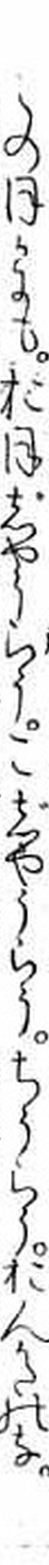このほかにも。おほじやうらう。こじやうらう。ちうらう。おんかたのな。
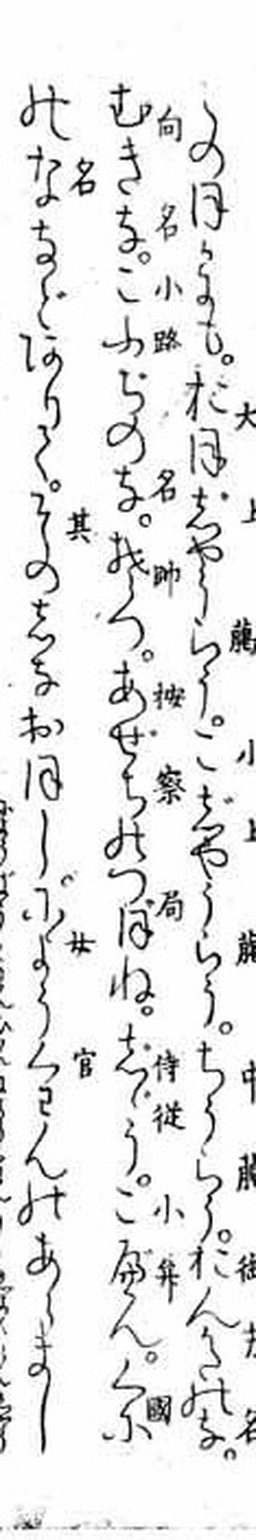むきな。こふぢのな。そつ。あぜちのつぼね。じゞう。こべん。くに
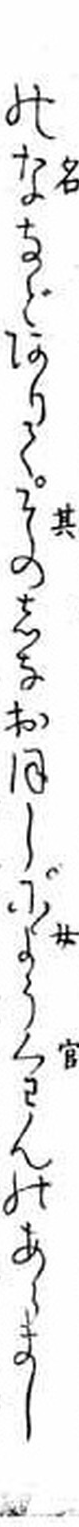のななどありて。そのしなおほし。にようくわんのあらまし
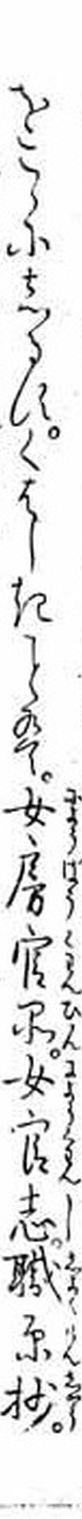をこゝにしるす。くはしきことは。女房官品。女官志。職原抄。
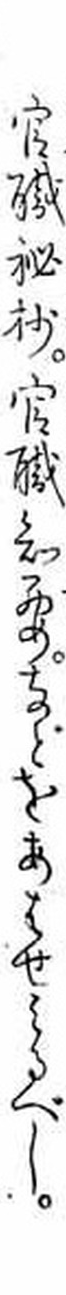官職秘抄。官職知要。などをあはせみるべし。
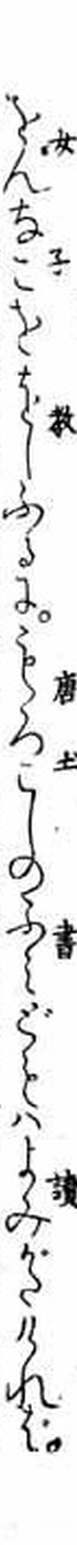をんなこををしふるに。もろこしのふみどもはよみがたければ。
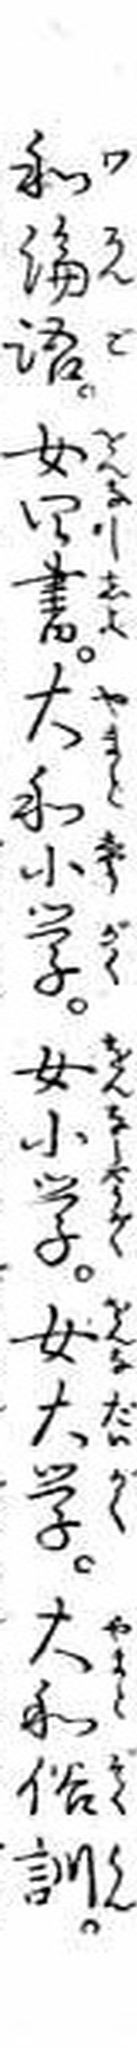和論語。女四書。大和小学。女小学。女大学。大和俗訓。
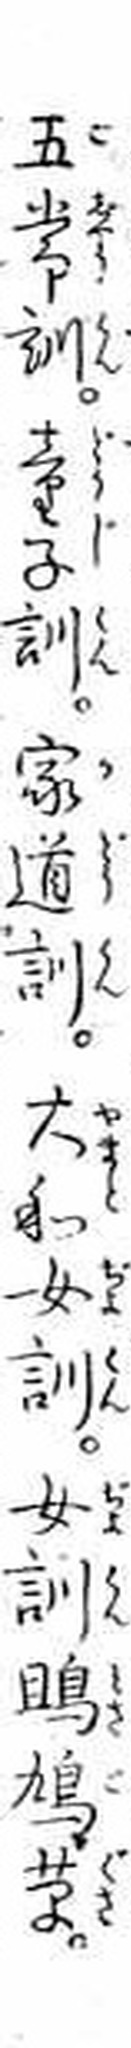五常訓。童子訓。家道訓。大和女訓。女訓雎鳩草。
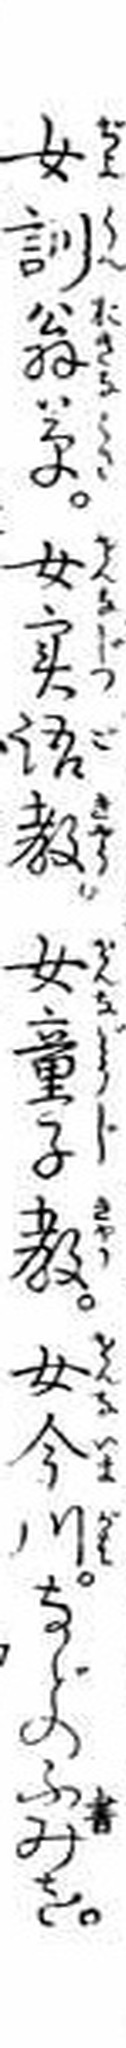女訓翁草。女実語教。女童子教。女今川。などのふみを。
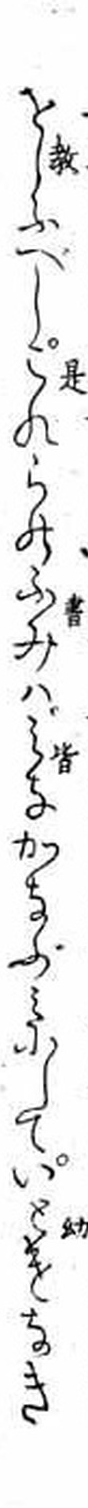をしふべし。これらのふみは。みなかなぶみにして。いとけなき
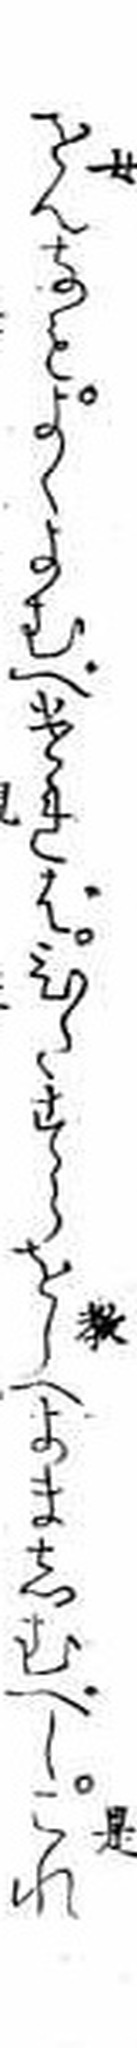をんなも。よくよむべければ。ひたすらをしへよましむべし。これ
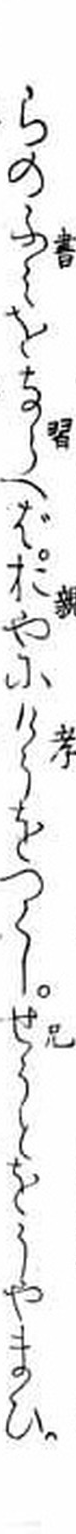らのふみをならへば。おやにけうをつくし。せうとをうやまひ。
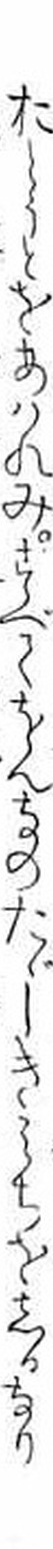おとうとをあはれみ。すべてをんなのたヾしきみちをしるなり
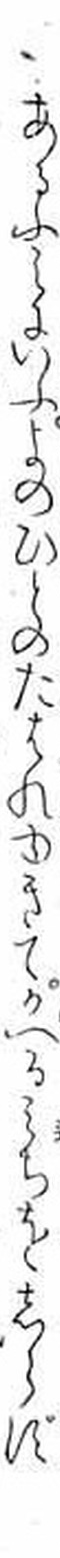あるふみにいふ。よのひとのたはれゆきて。かへるみちをしらず
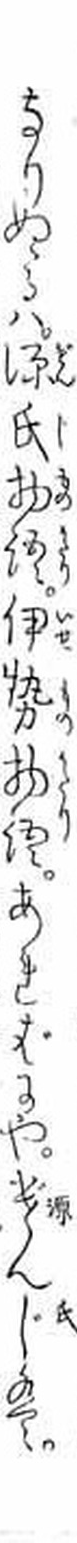なりぬるは。源氏物語。伊勢物語。あればにや。げんじは。
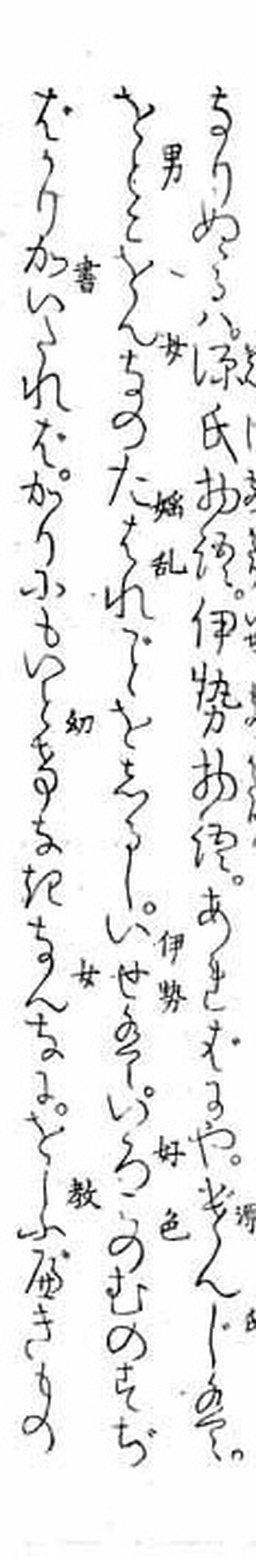をとこをんなのたはれごとをしるし。いせは。いろこのむのすぢ
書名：女学範
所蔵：東京学芸大学教育コンテンツアーカイブ
